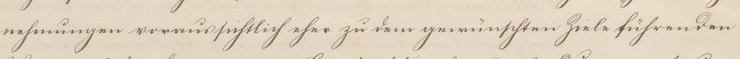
nehmungen voraussichtlich eher zu dem gewünschten Ziele führenden
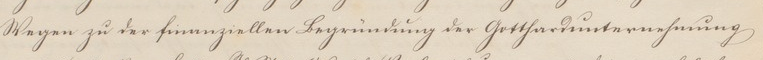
Wegen zu der finanziellen Begründung der Gotthardunternehmung
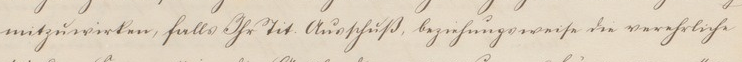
mitzuwirken, falls Ihr Tit. Ausschuß, beziehungsweise die verehrliche
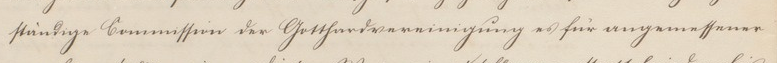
ständige Commission der Gotthardvereinigung es für angemessener
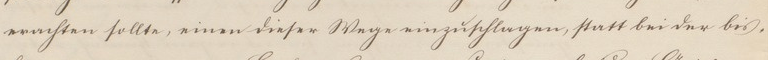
erachten sollte, einen dieser Wege einzuschlagen, statt bei der bis-
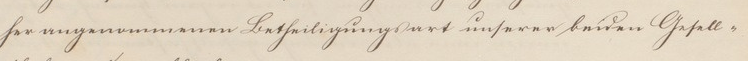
her angenommenen Betheiligungsart unserer beiden Gesell-
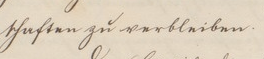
schaften zu verbleiben.
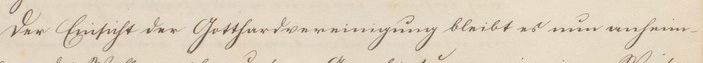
Der Einsicht der Gotthardvereinigung bleibt es nun anheim-
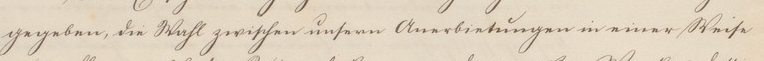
gegeben, die Wahl zwischen unsern Anerbietungen in einer Weise
